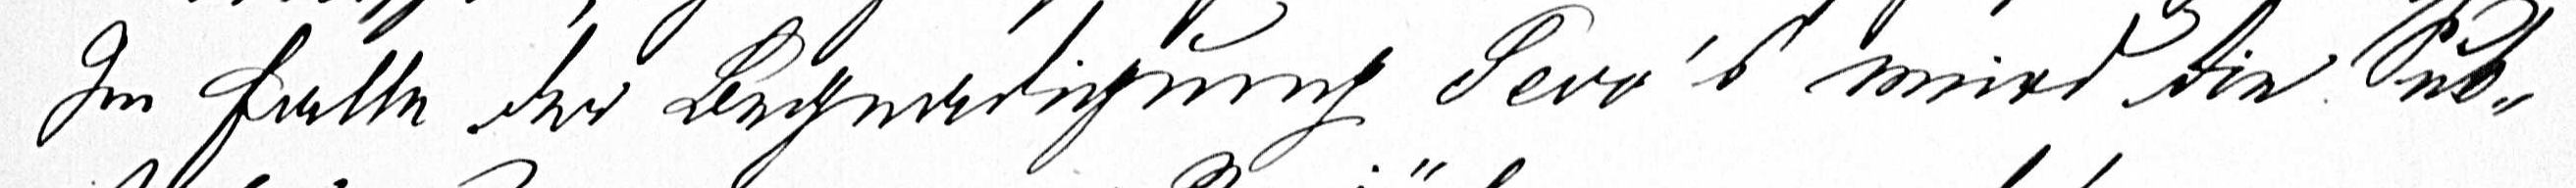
In Falle der Begnadigung Ševo’s wird die Sub¬
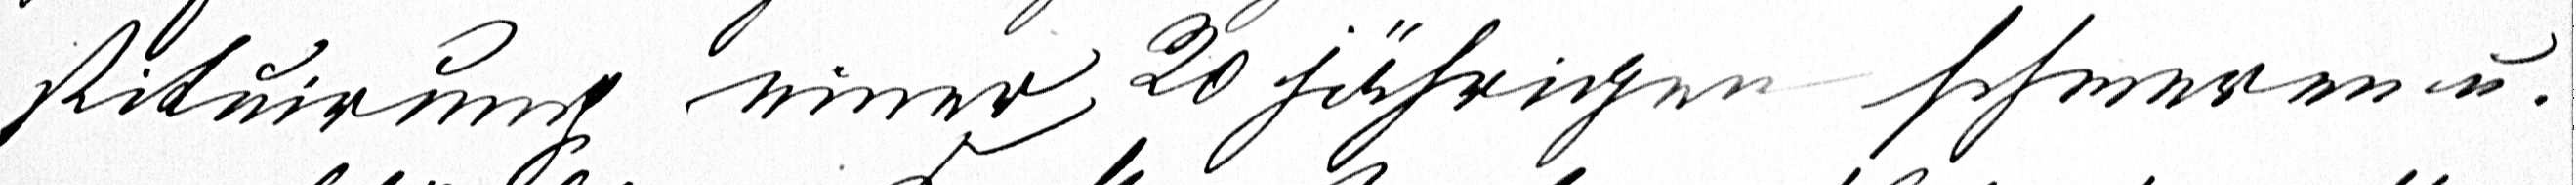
stituirung einer 20jährigen schweren u.
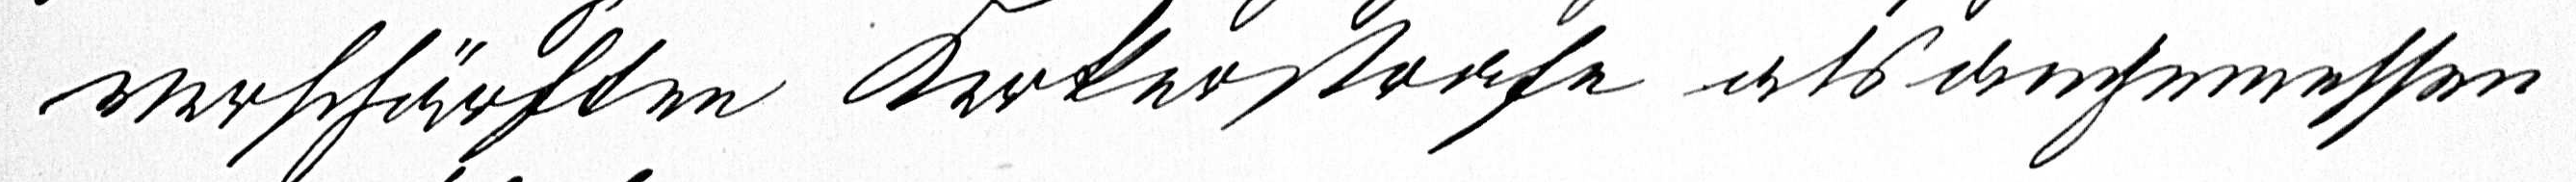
verschärften Kerkerstrafe als angemessen
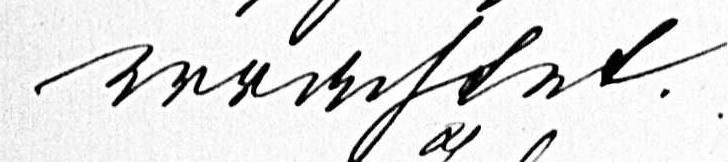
erachtet.
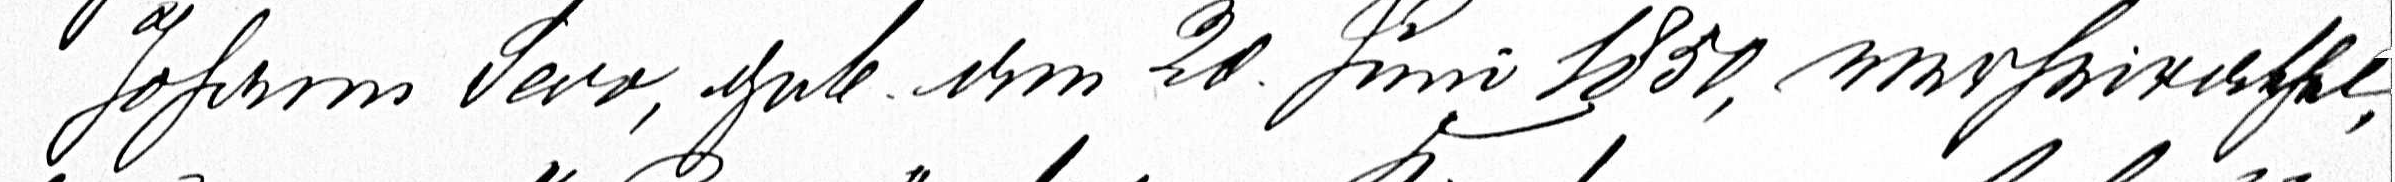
Johann Ševo, geb. am 20. Juni 1850, verheirathet,
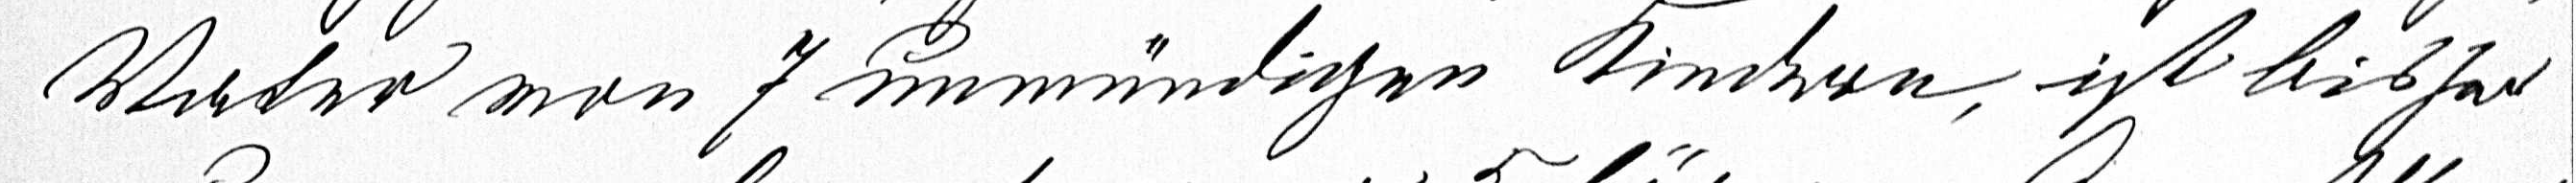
Vater von 7 unmündigen Kindern, ist bisher
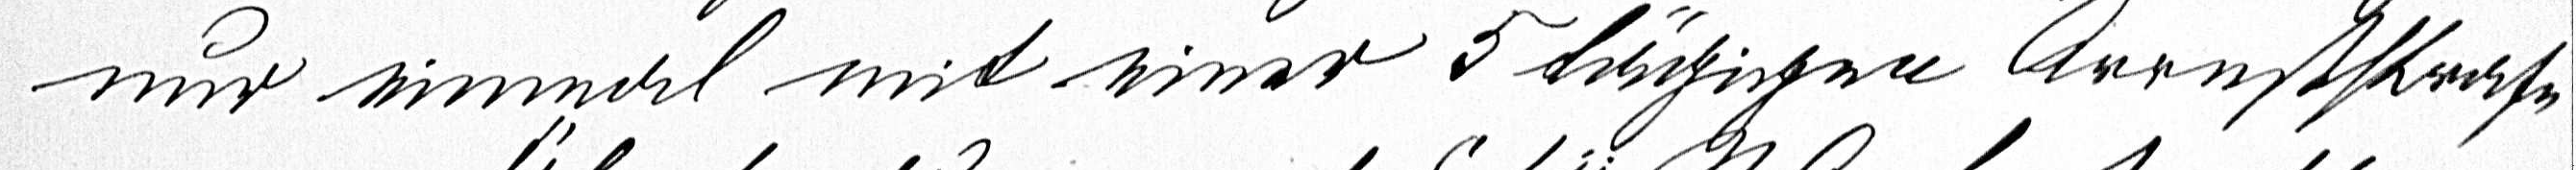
nur einmal mit einer 5tägigen Arreststrafe
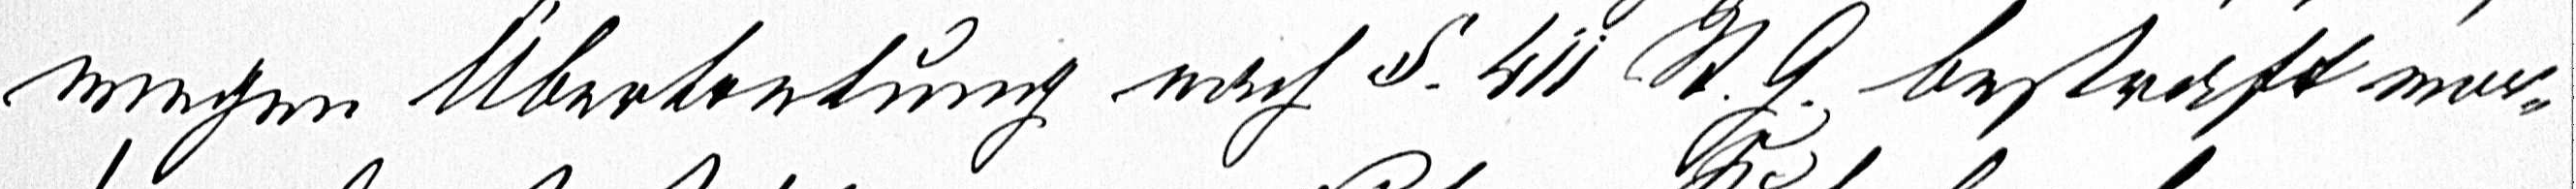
wegen Übertretung nach §411 St. G bestraft wor¬
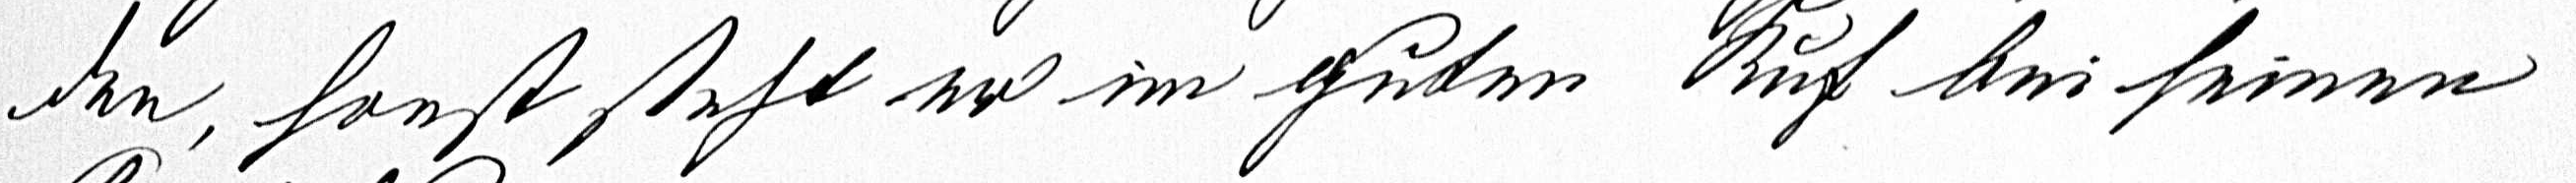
den, sonst steht er im guten Ruf bei seinen
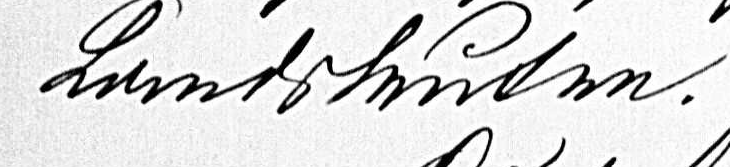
Landsleuten.
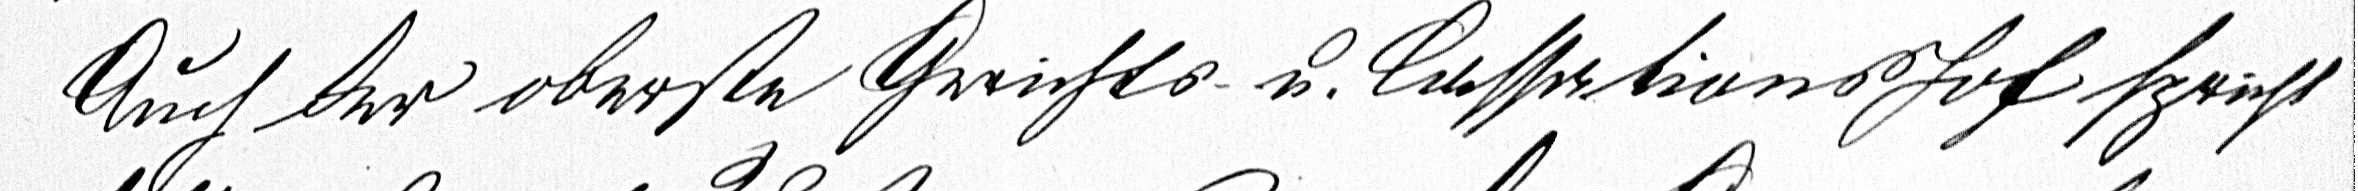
Auch der oberste Gerichts- u. Cassationshof spricht
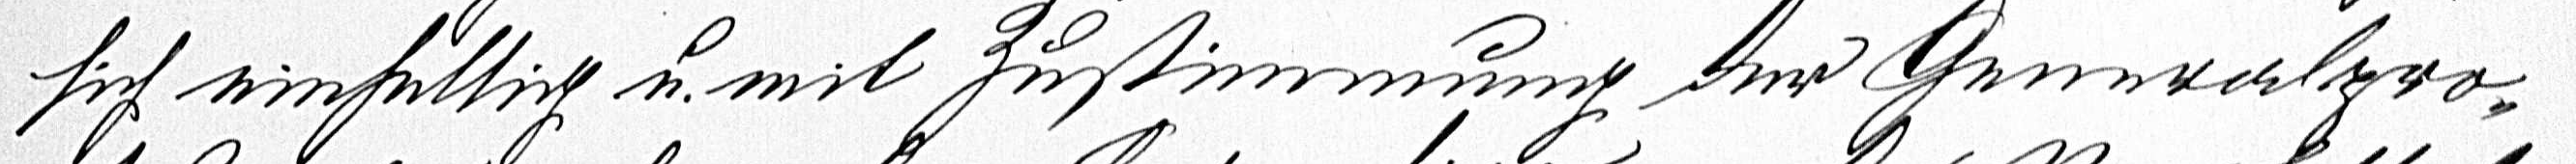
sich einhellig u. mit Zustimmung der Generalpro¬
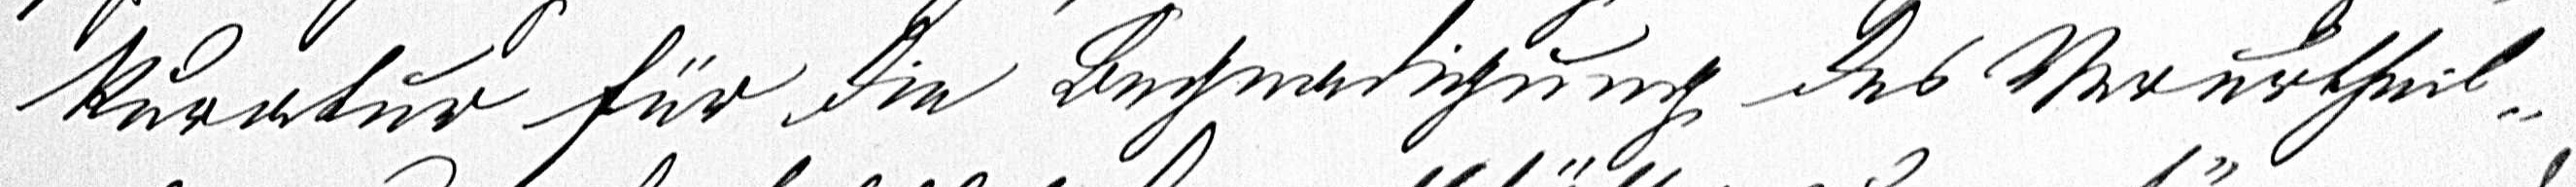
kuratur für die Begnadigung des Verurtheil¬
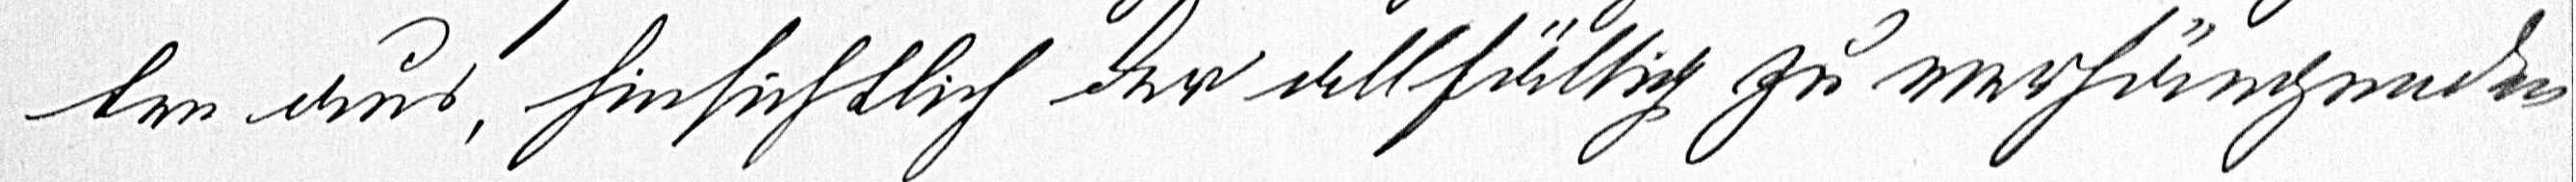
ten aus, hinsichtlich der allfällig zu verhängenden
